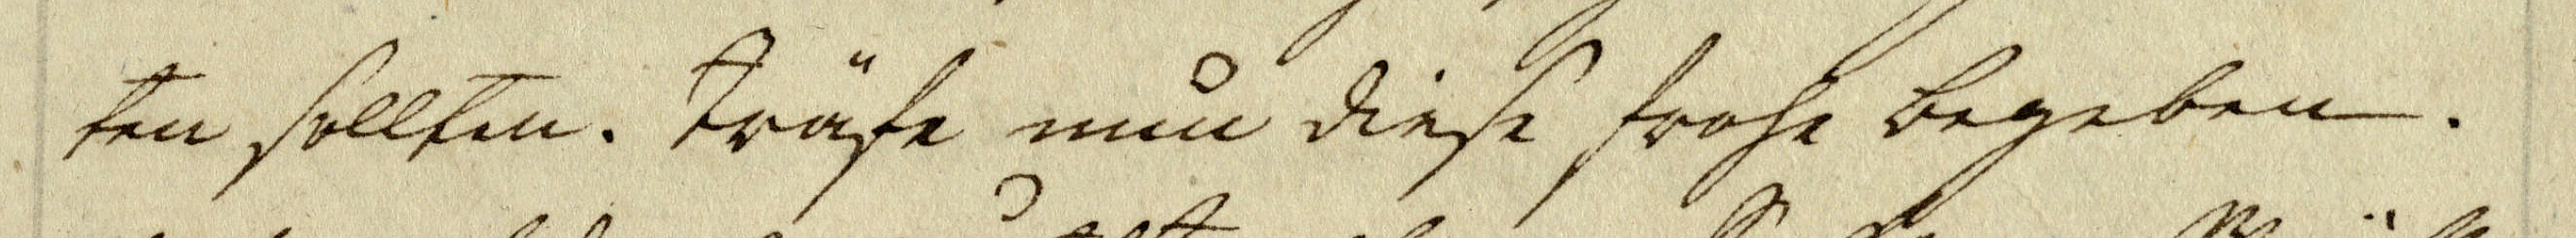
ten sollten. Träfe nun diese frohe Begeben¬
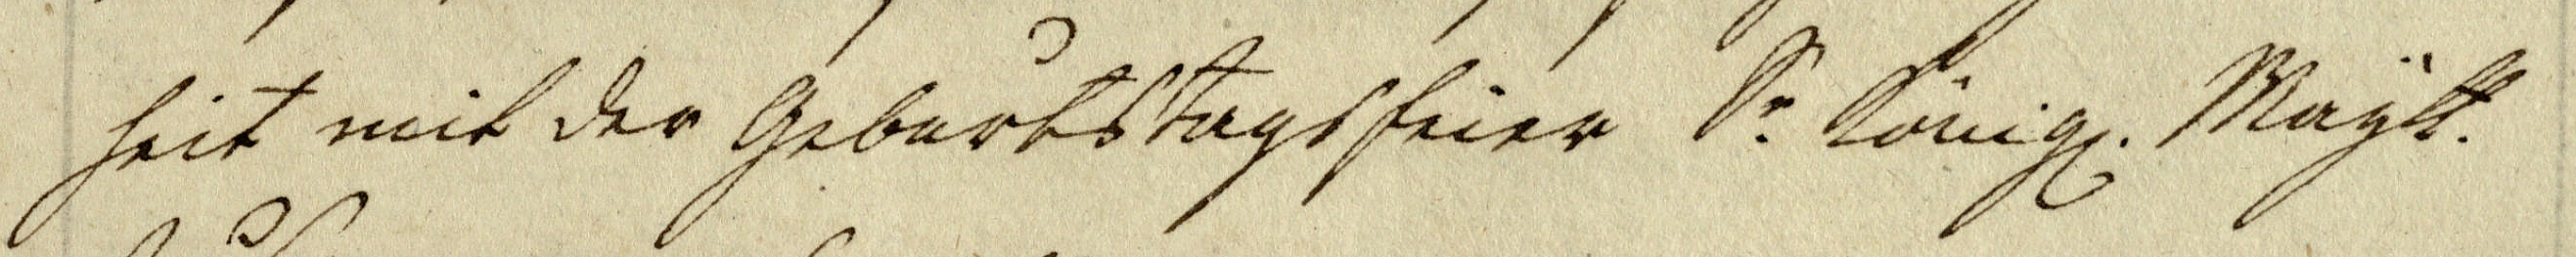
heit mit der Geburtsagsfeier Sr. Königl. Maÿtt.
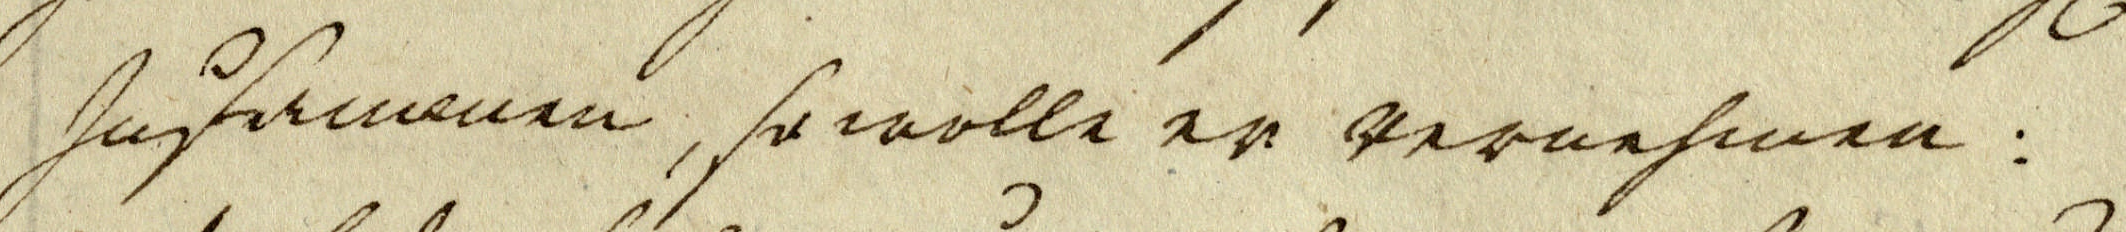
zusammen, so wolle er vernehmen:
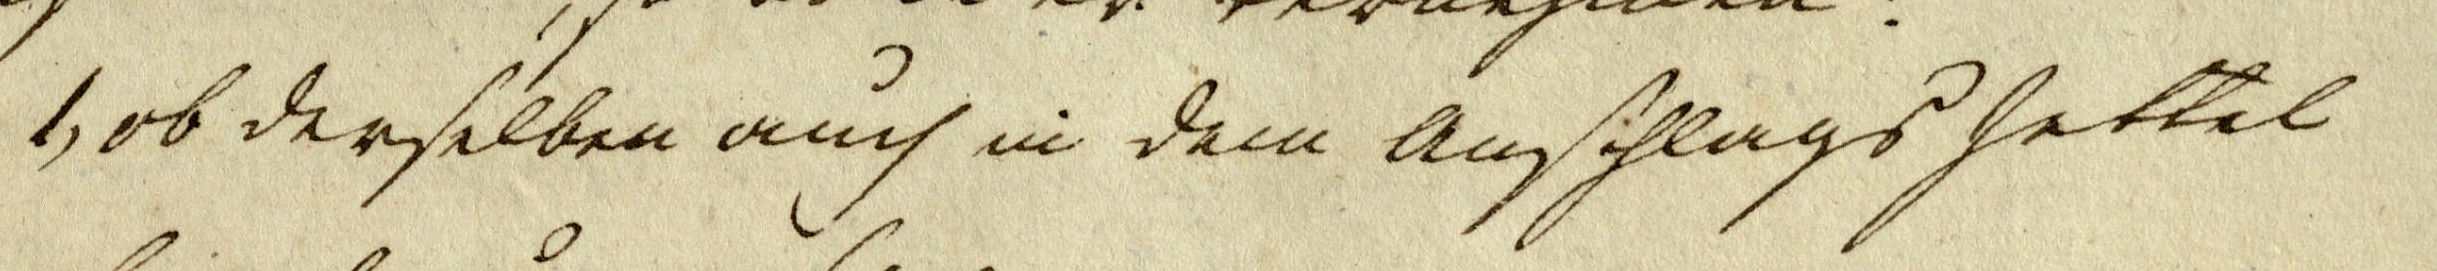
1, ob derselben auch in dem Anschlags Zettel
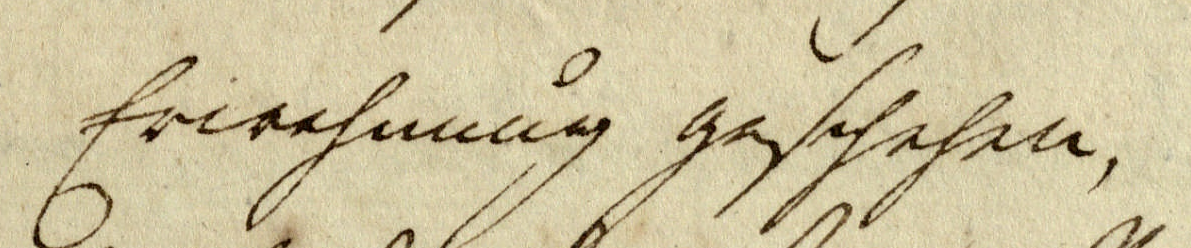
Erwehnung geschehen,
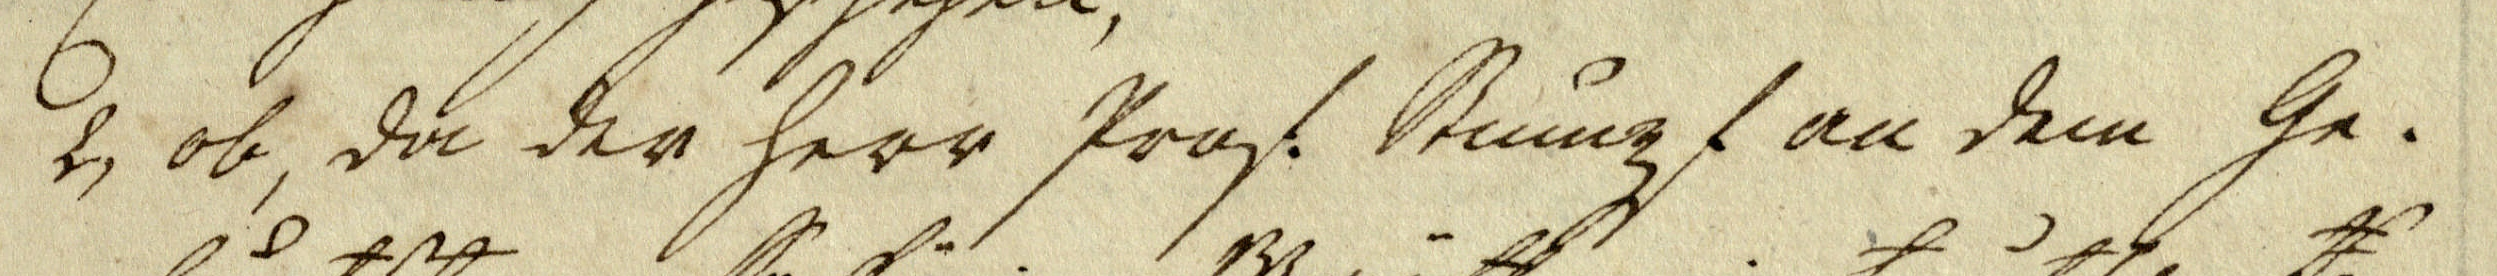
2, ob, da der Herr Prof. Stumpf an dem Ge¬
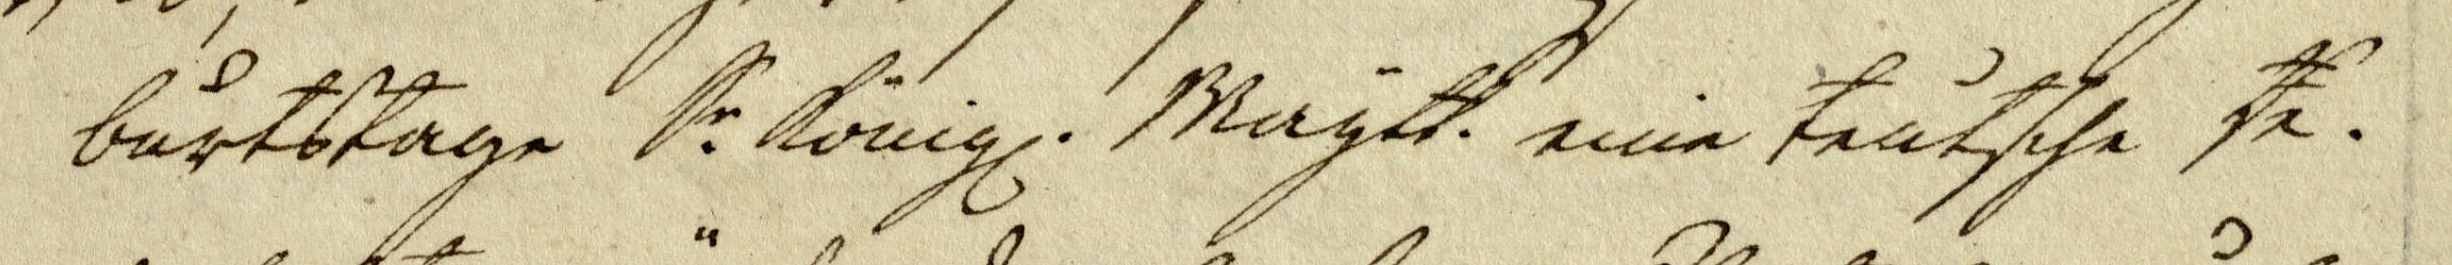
burtstage Sr Königl. Maÿtt. eine teutsche Re¬
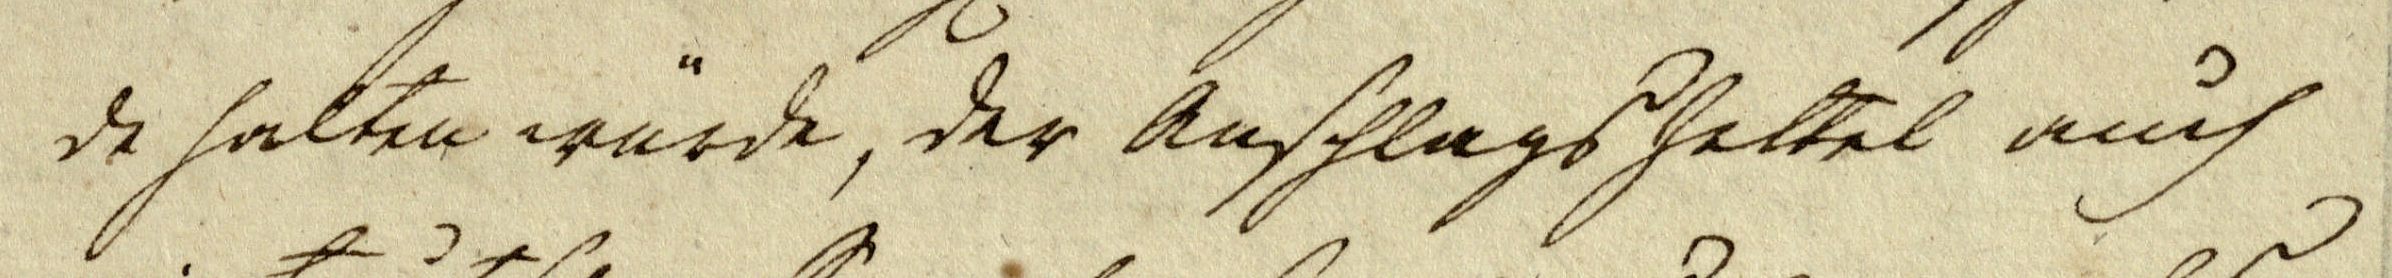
de halten würde, der Anschlags Zettel auch
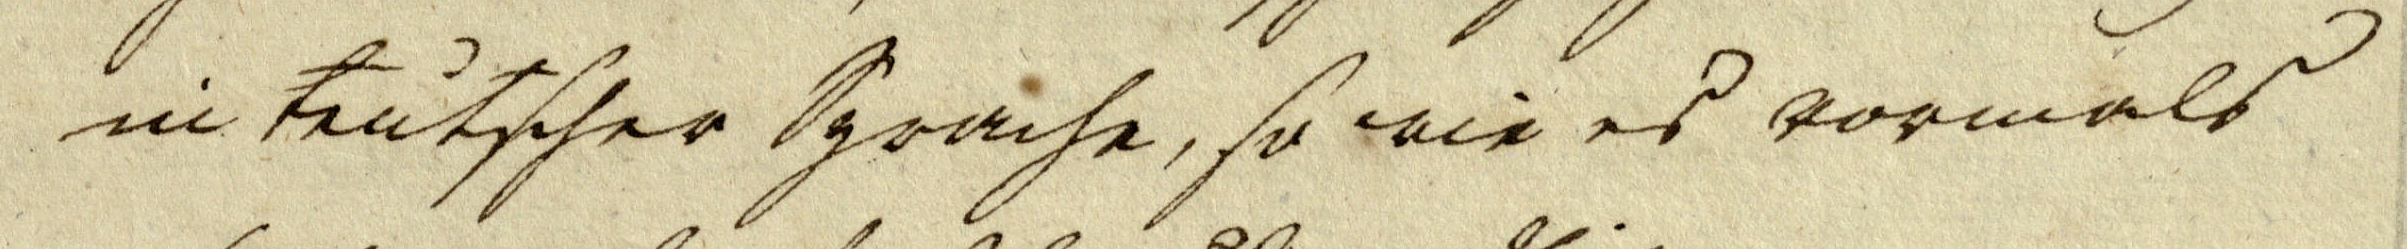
in teutscher Sprache, so wie es vormals
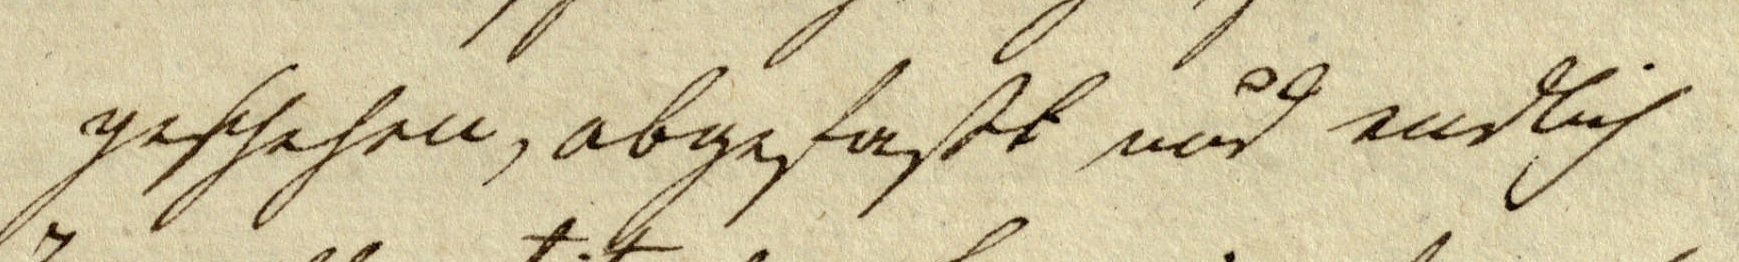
geschehen, abgefaßt und endlich
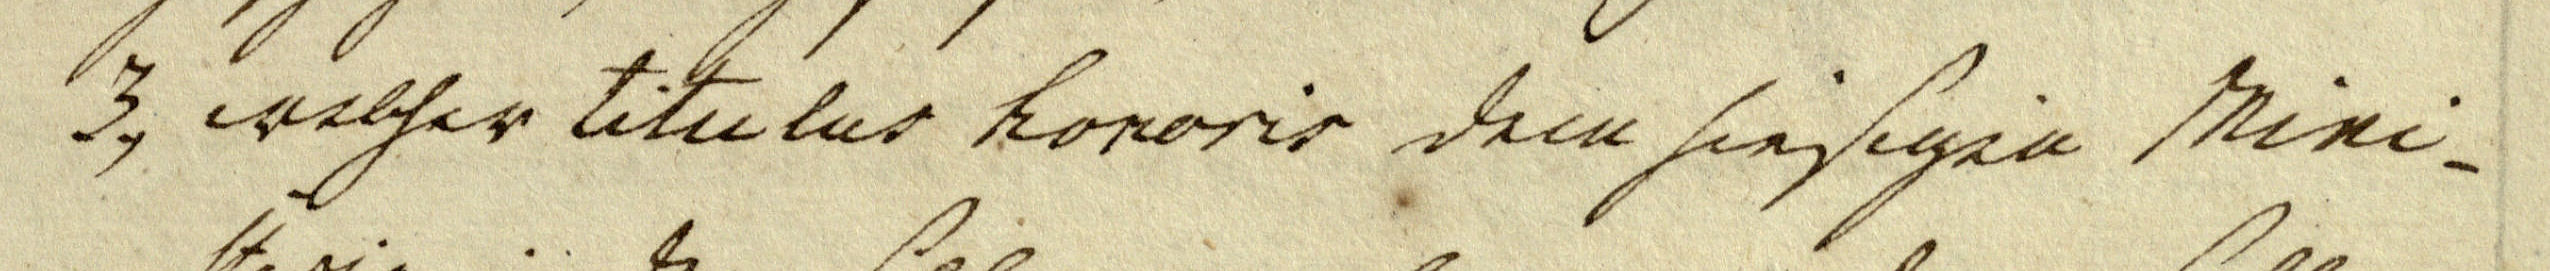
3., welcher titulus honoris dem hiesigen Mini¬
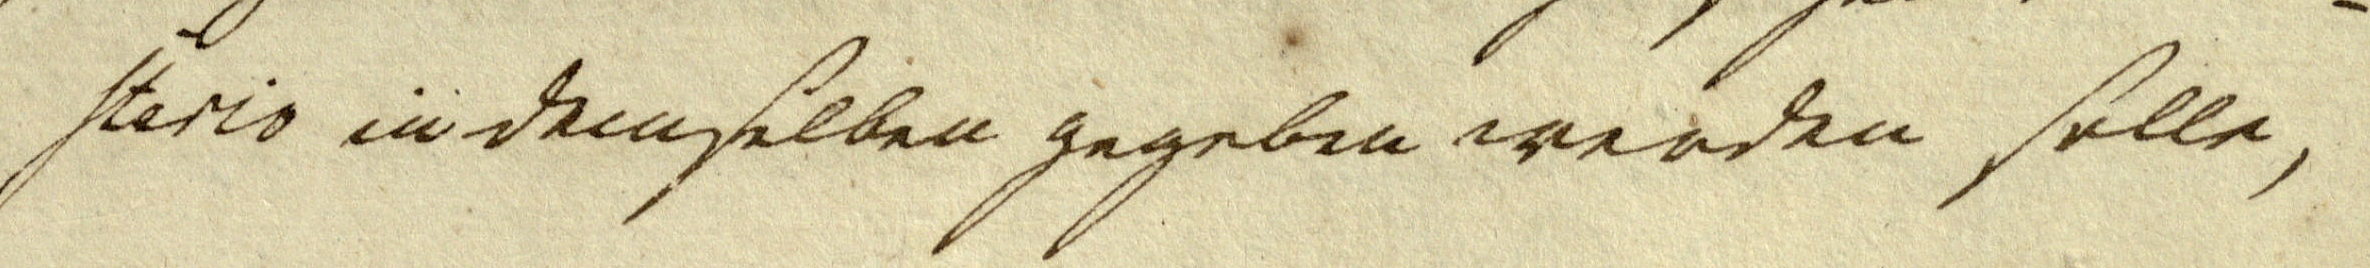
sterio in demselben gegeben werden solle,
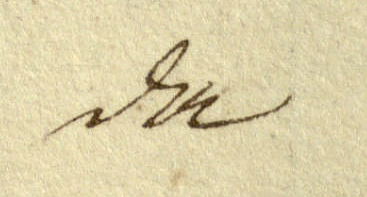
da
